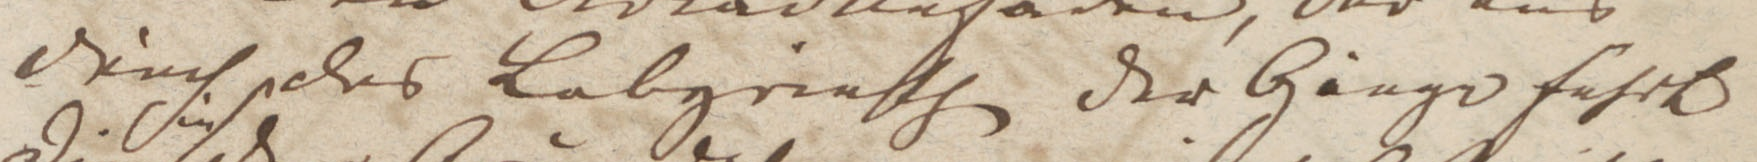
durch das Labyrinth der Gänge führt
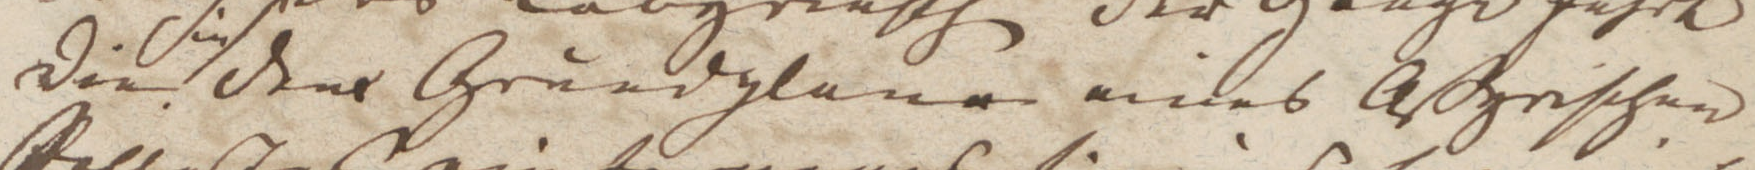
die in denm Grundplane eines Assyrischen
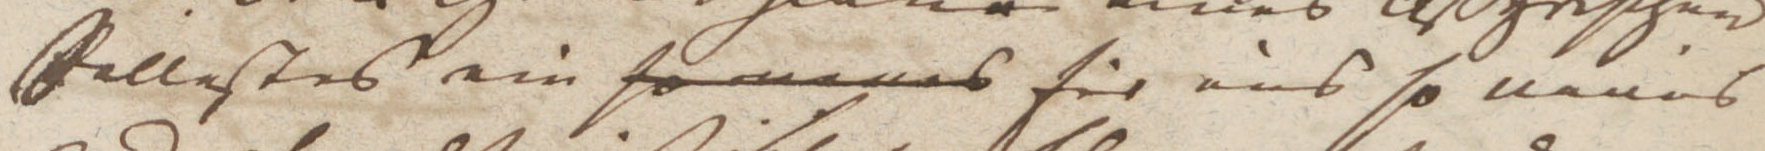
Pallastes ein so neues für uns so neues
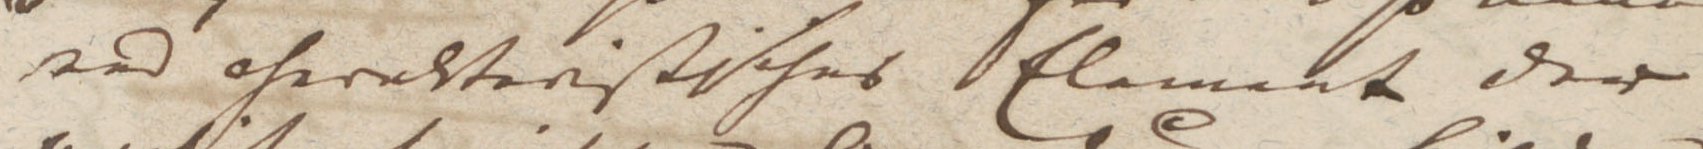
und charakteristisches Element der
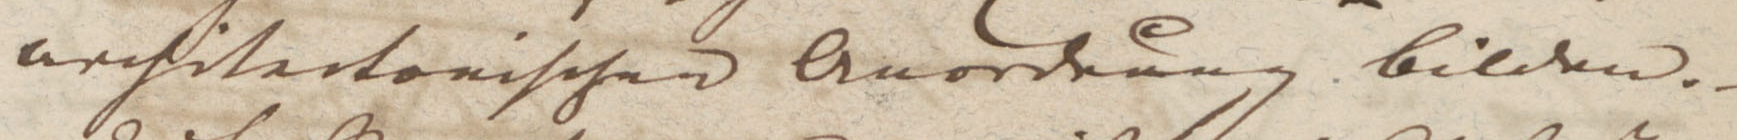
architectonischen Anordnung bilden. –
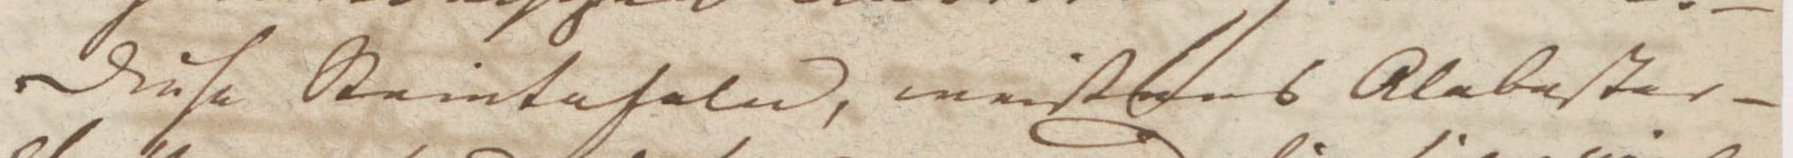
Diese Steintafeln, meistens Alabaster-
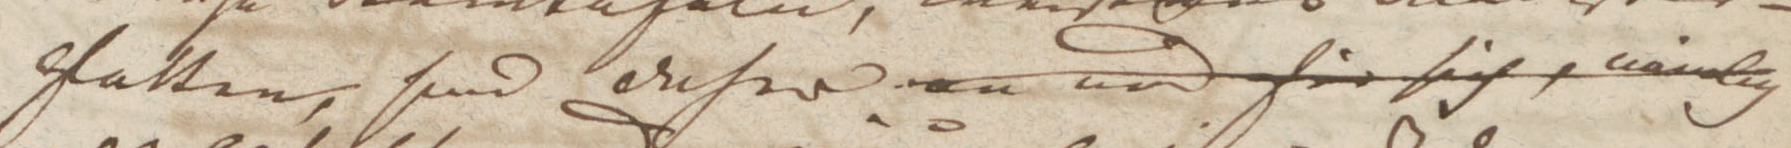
platten, sind daher an und für sich, nämlich
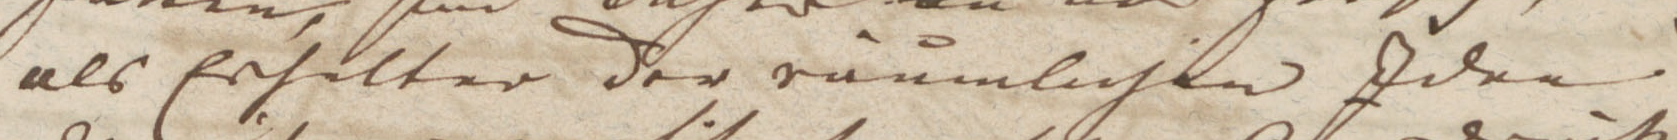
als Erhalter der räumlichen Idee
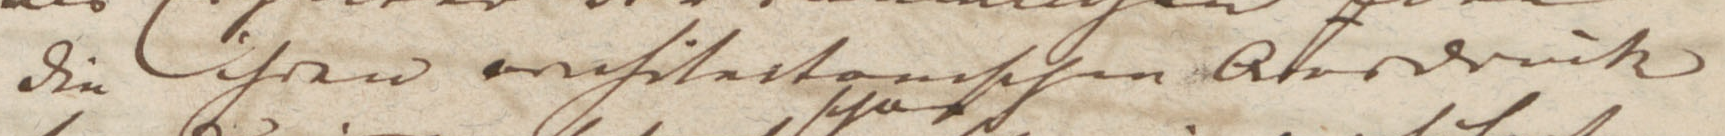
die ihren architectonischen Ausdruck
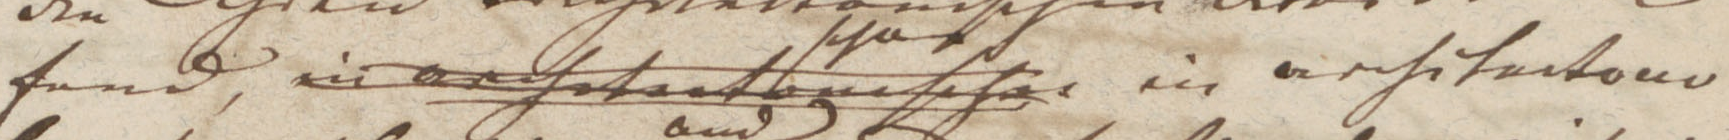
fand, in architectonisch schon in architectono
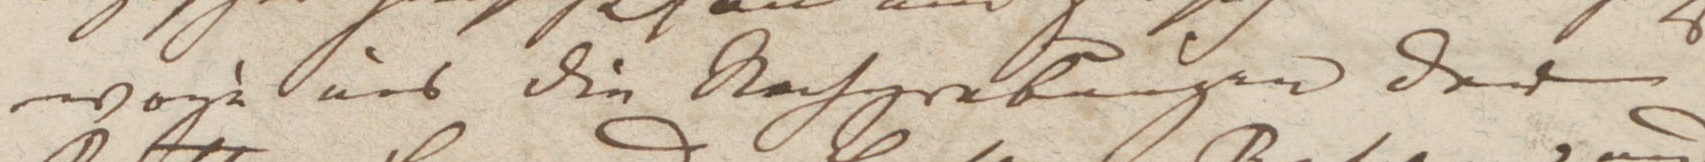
wozu uns die Nachgrabungen der
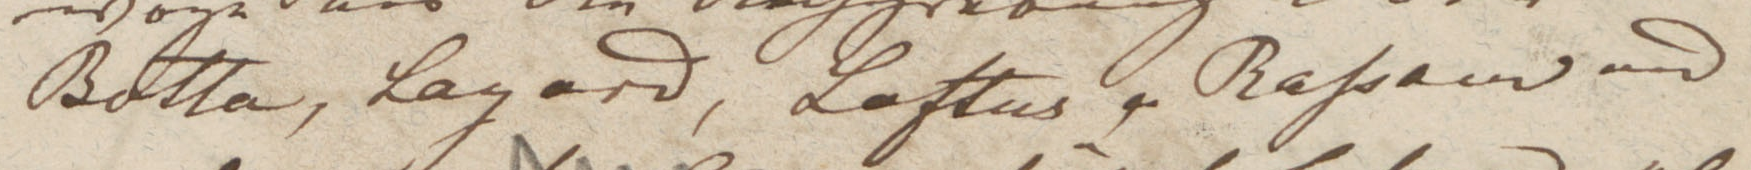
Botta, Layard, Loftus Rassam und
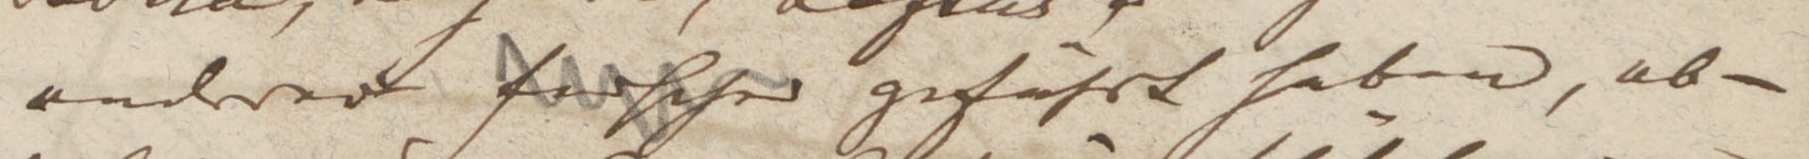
anderer Forscher geführt haben, ab-
